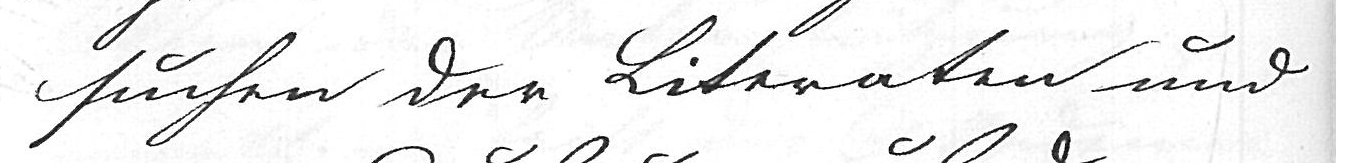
suchen der Literaten und
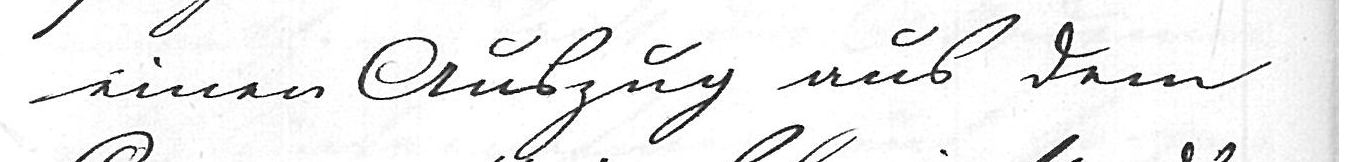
einen Auszug aus dem
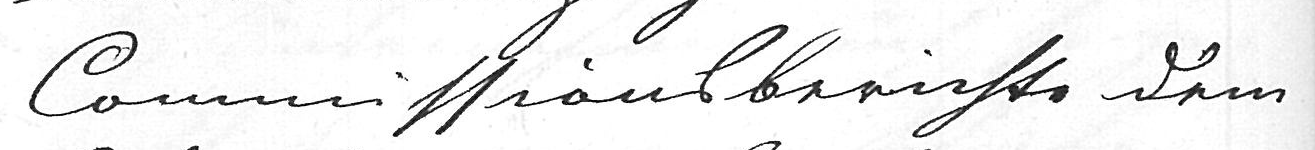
Commissionsberichte dem
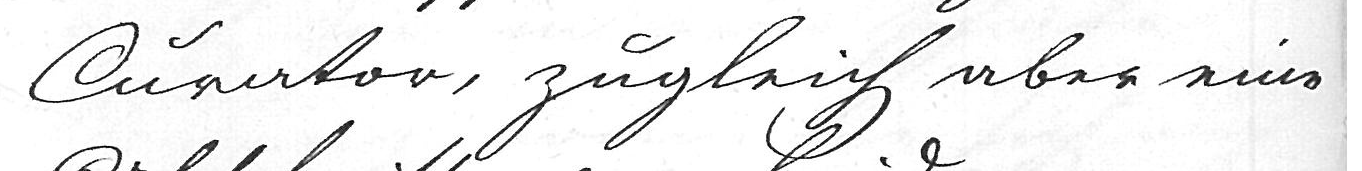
Curator, zugleich aber eine
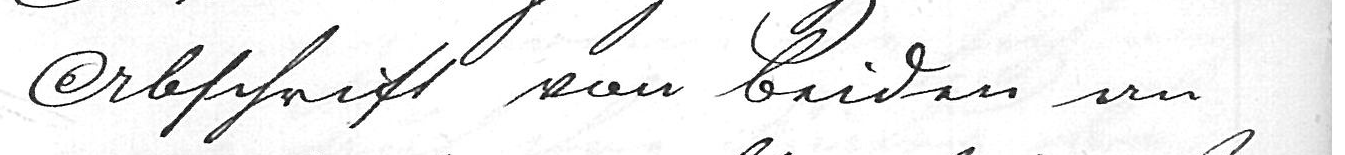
Abschrift von beiden an
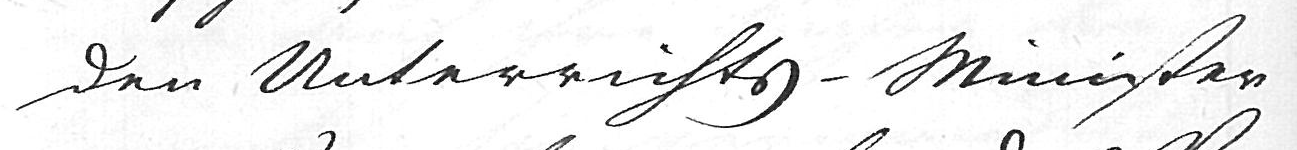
den Unterrichts-Minister
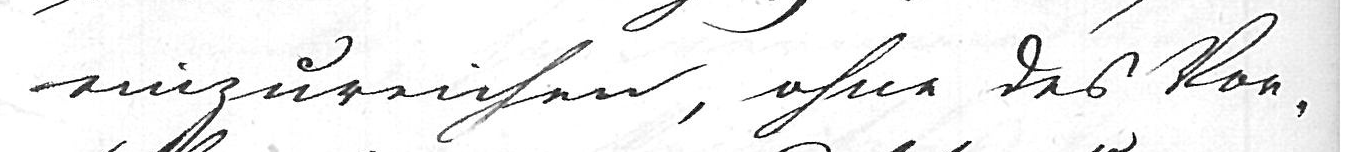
einzureichen, ohne des Vor-
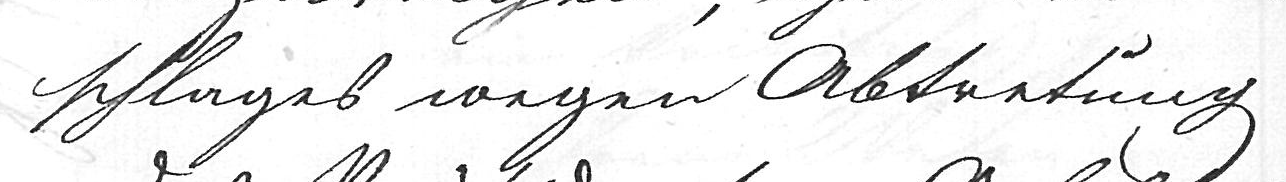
schlages wegen Abtretung
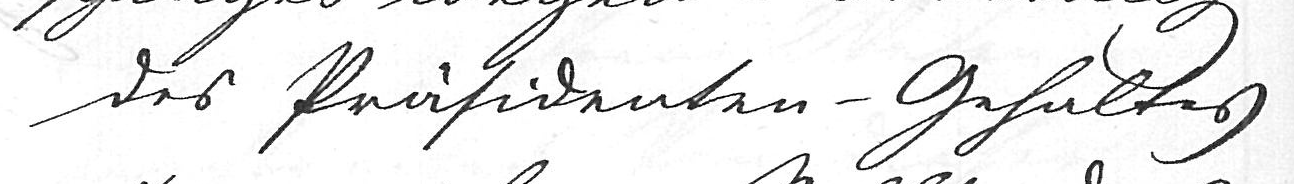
des Präsidenten-Gehaltes
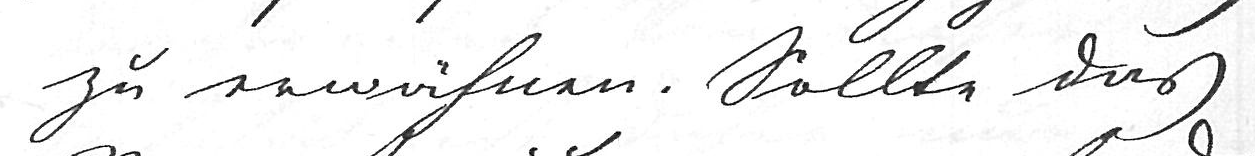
zu erwähnen. Sollte das
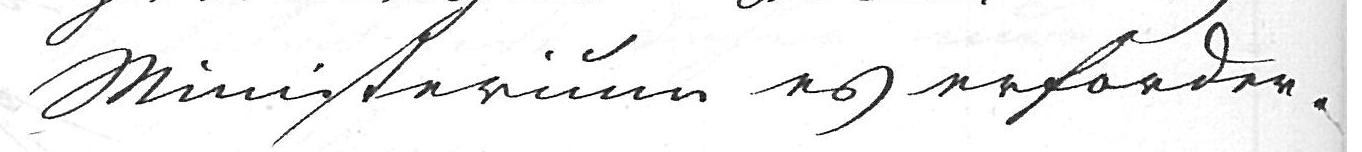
Ministerium es erforder-
